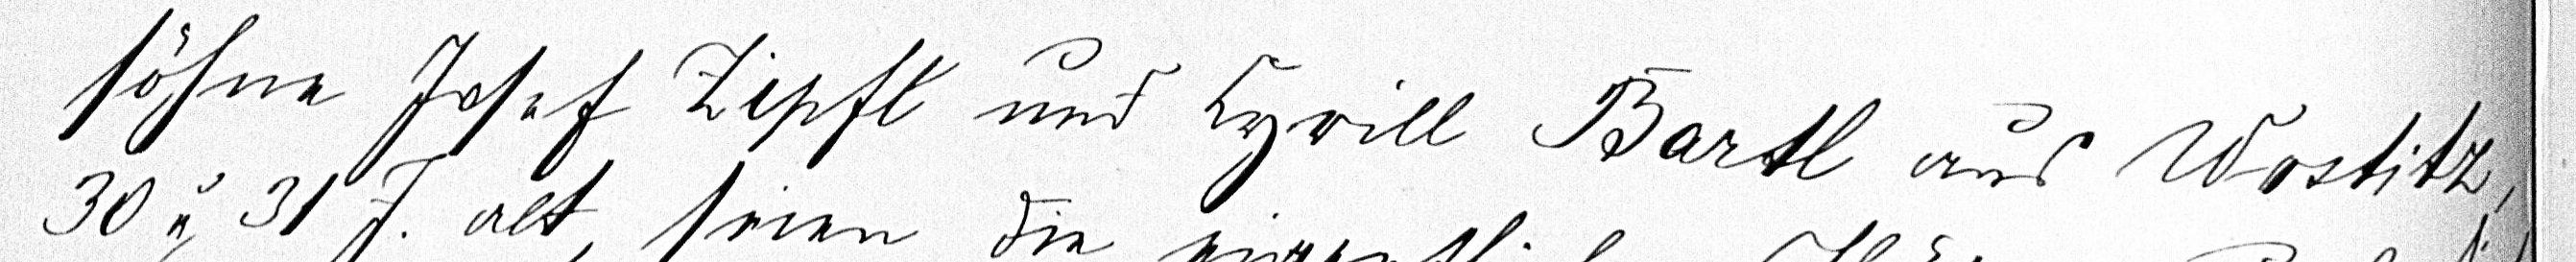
söhne Josef Zipft und Cyrill Bartl aus Wostitz,
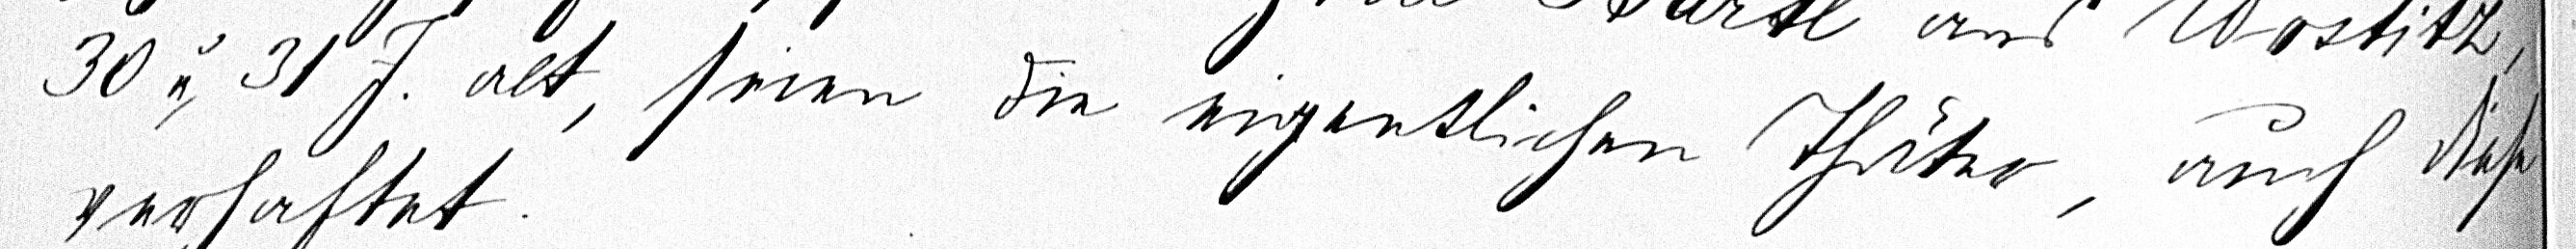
30 u. 31 J. alt, seien die eigentlichen Thäter, auch diese
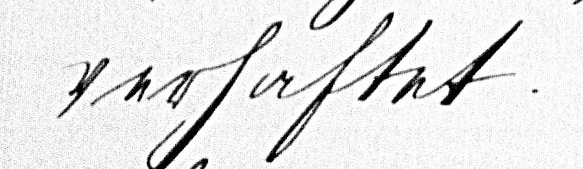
verhaftet.
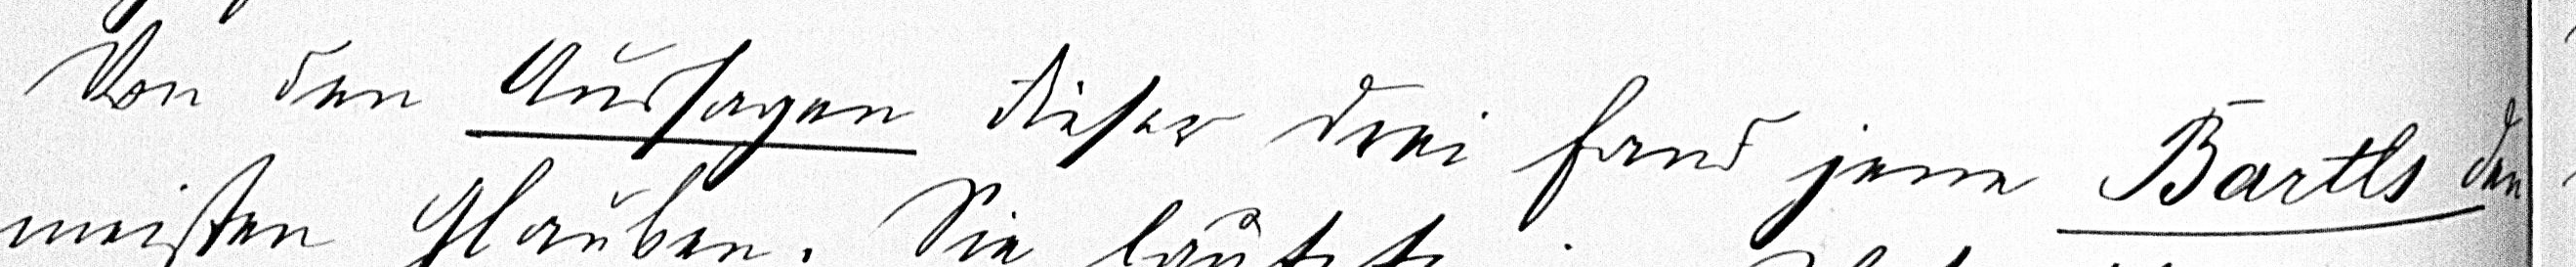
Von den Aussagen dieser drei Fand jene Bartls den
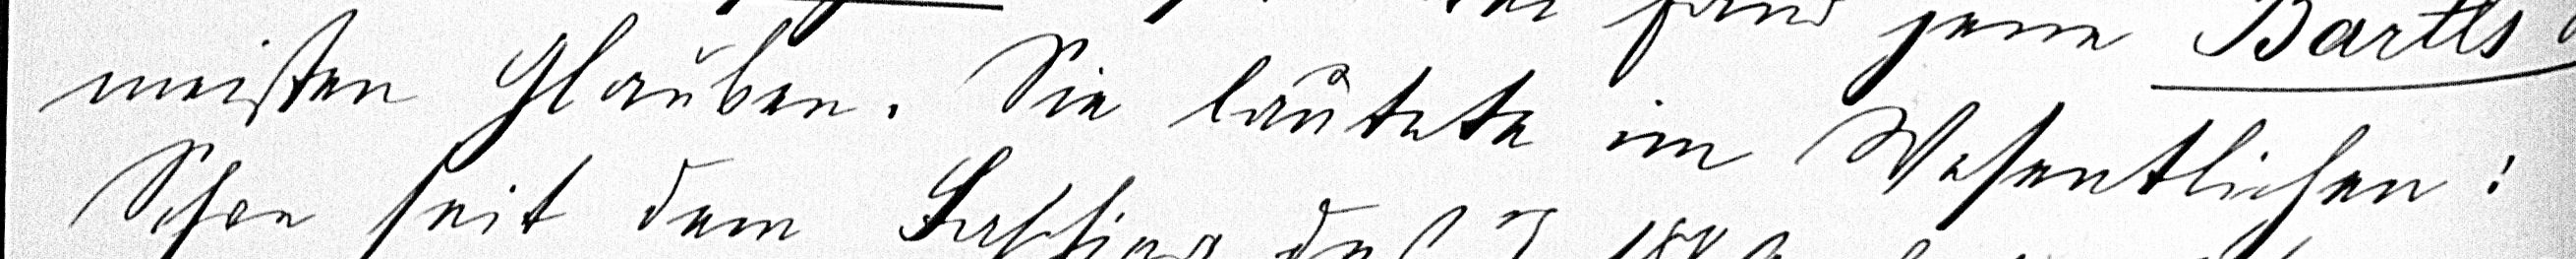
meisten Glauben. Sie lautete im Wesentlichen:
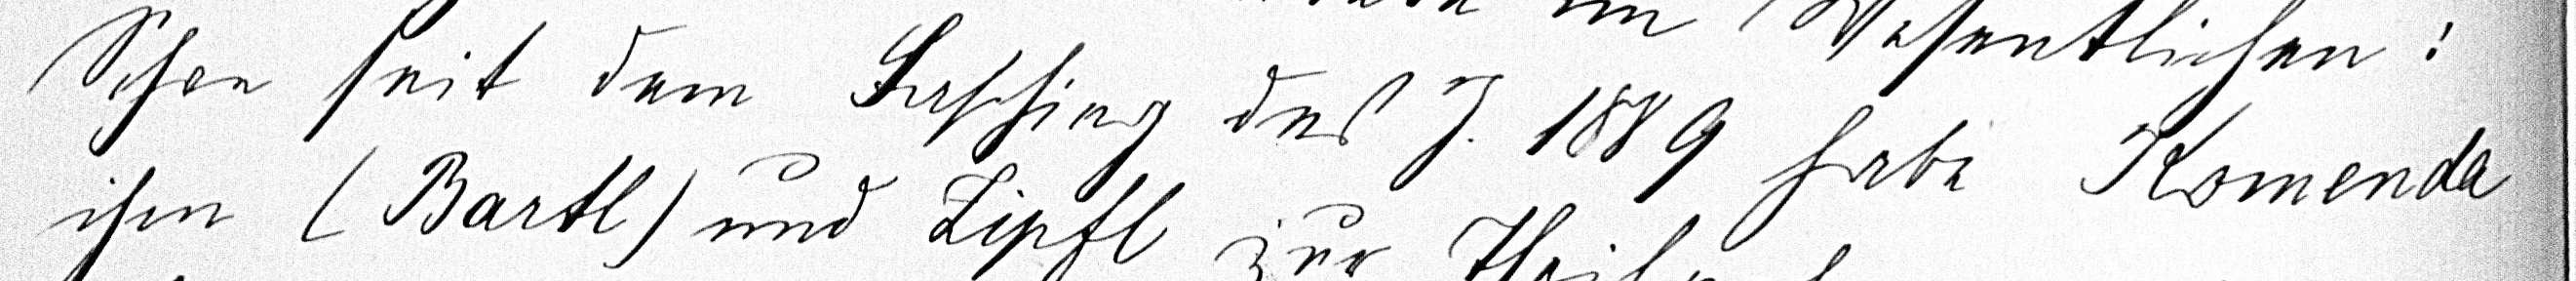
Schon seit dem xxhieg des J. 1889 habe Komenda
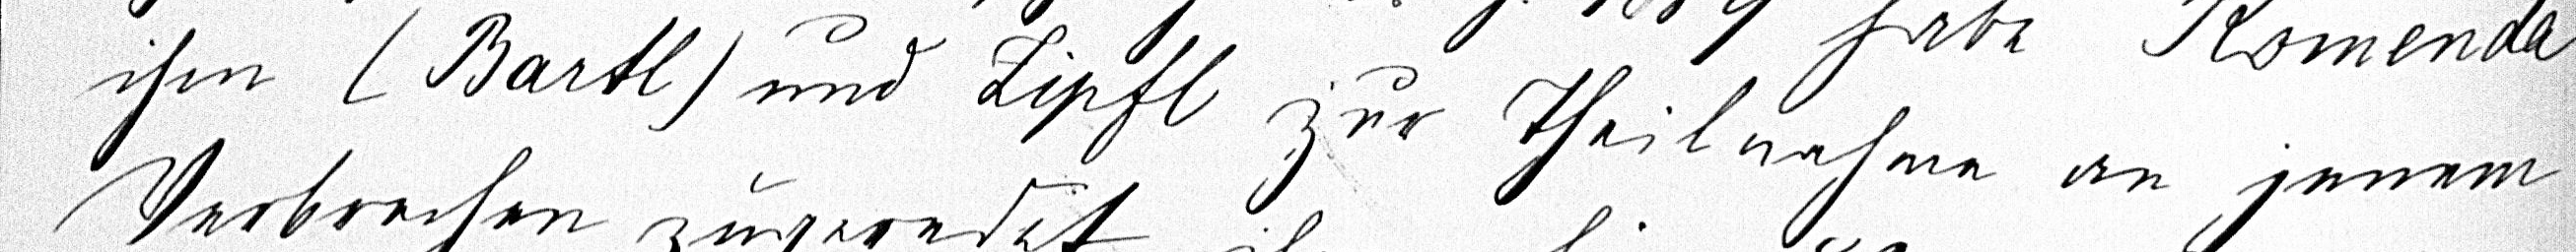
ihm (Bartl) und Lipfl zur Theilnahme an jenem
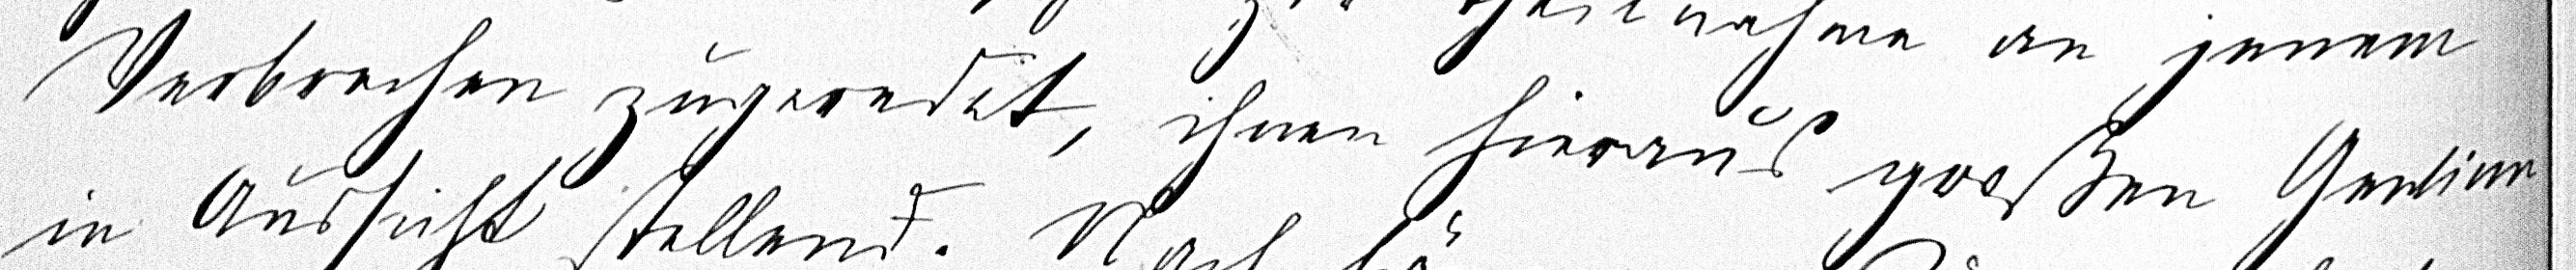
Verbrechen zugeredet, ihnen hieraus großen Gewinn
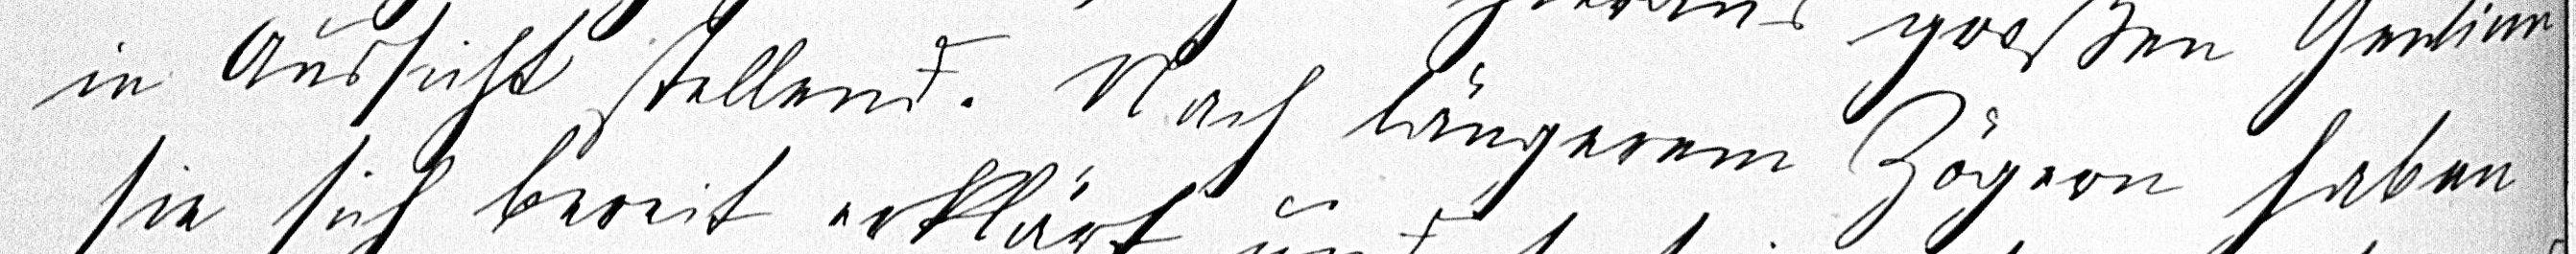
in Aussicht stellend. Nach längerem Zögern haben
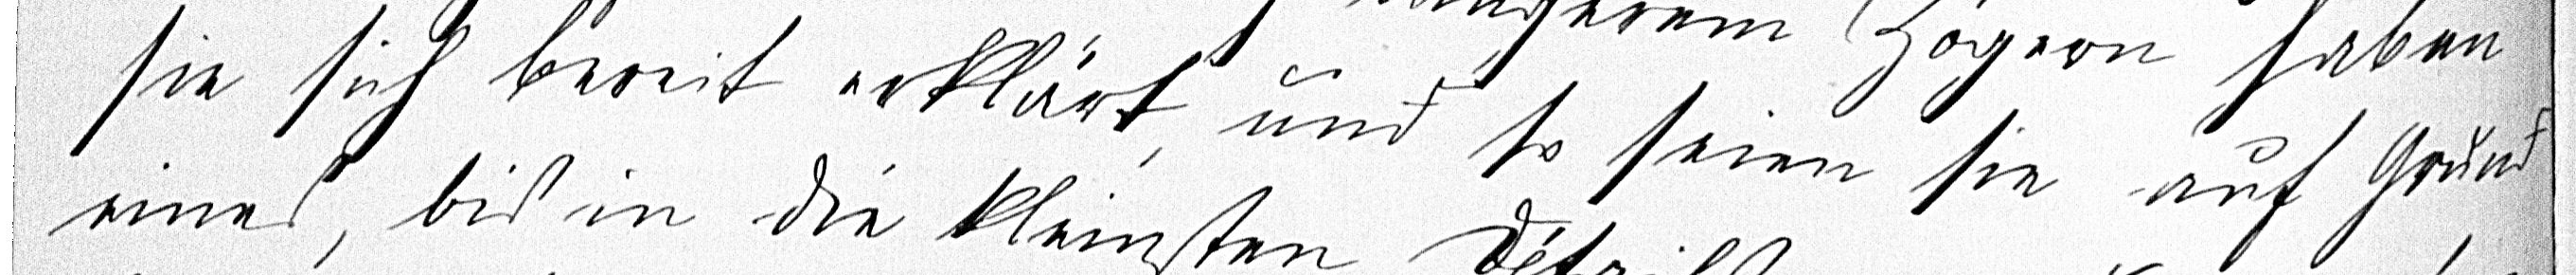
sie sich bereit erklärt, und so seien sie af Grund
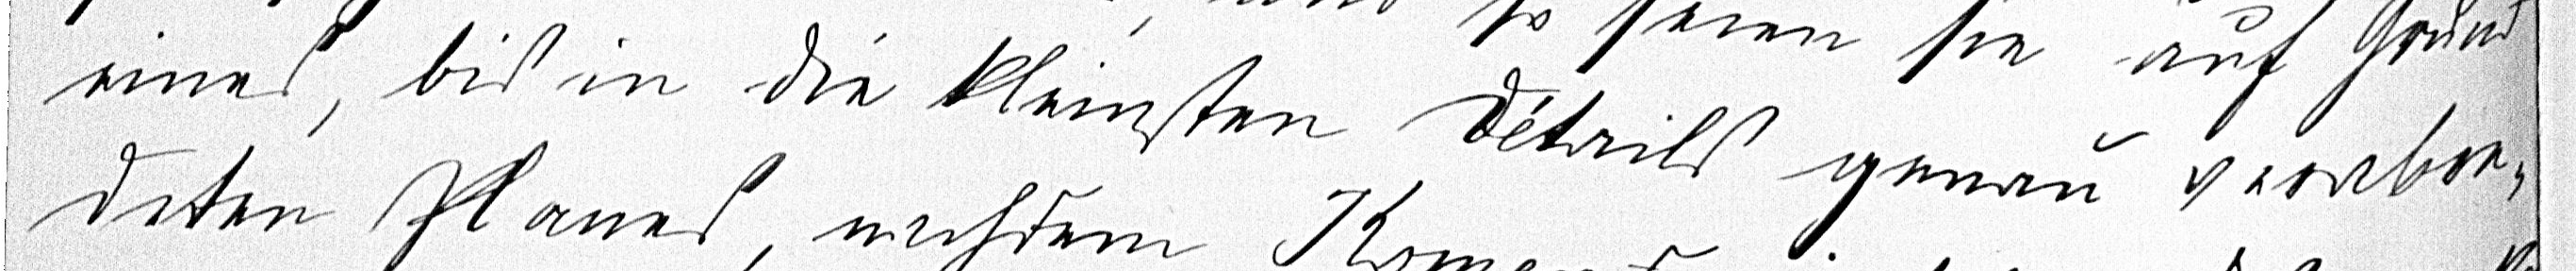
eines, bis in die kleinsten Détails genau verabre¬
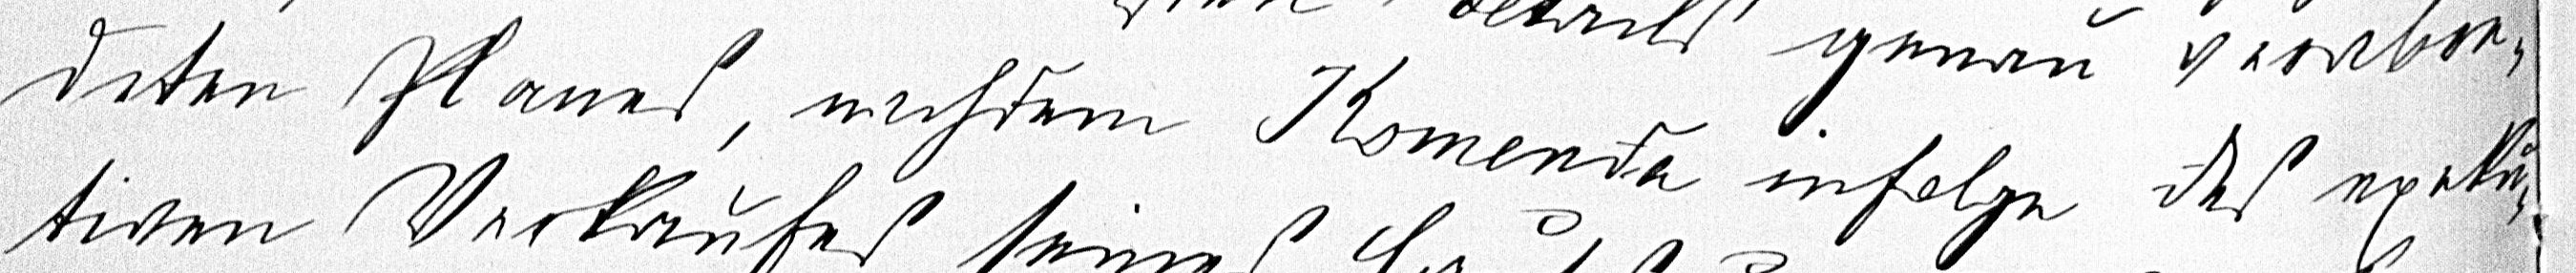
deten Planes, nachdem Komenda infolge des exeku¬
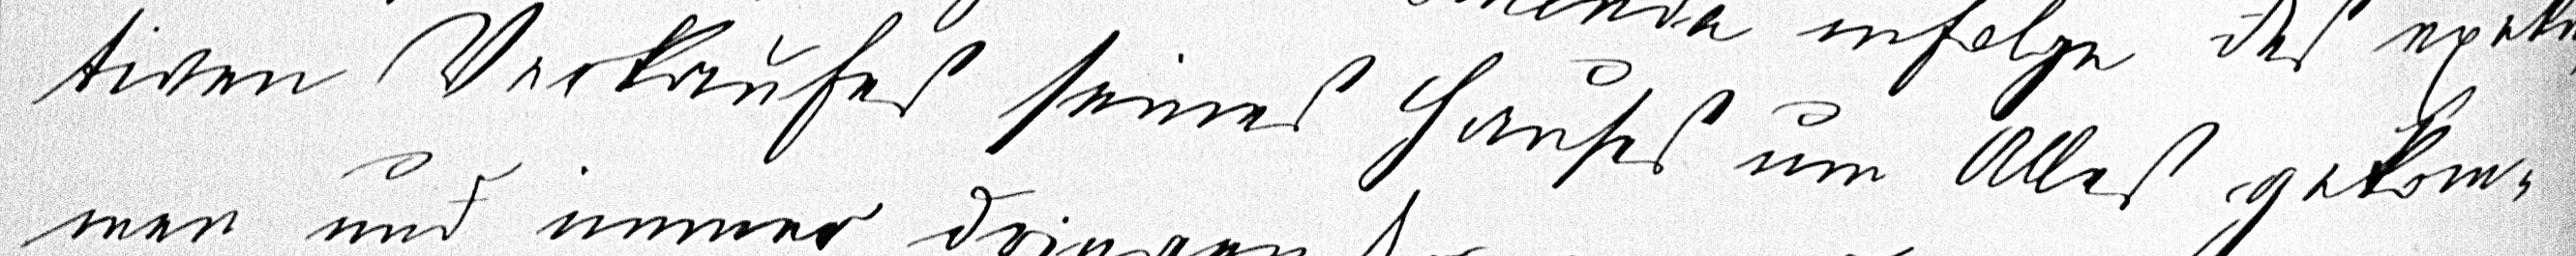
tiven Verkaufes seines Hauses um Alles gekom¬
